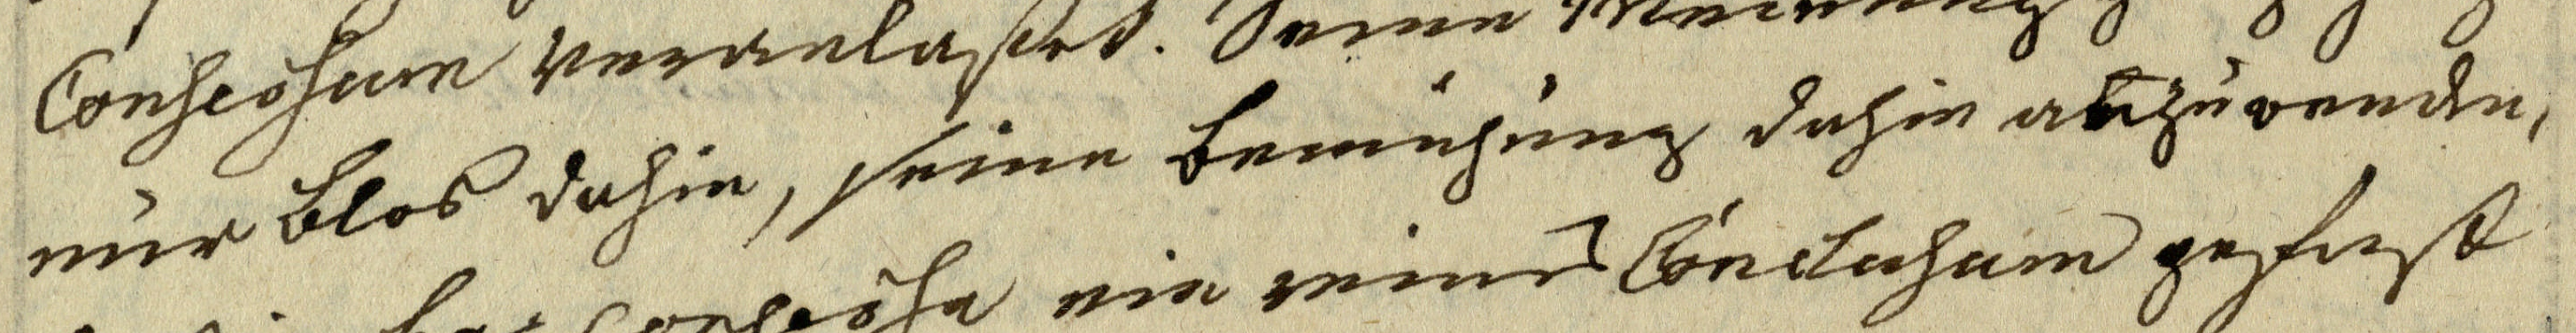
nur blos dahin, seine Bemühung dahin abzuwenden,
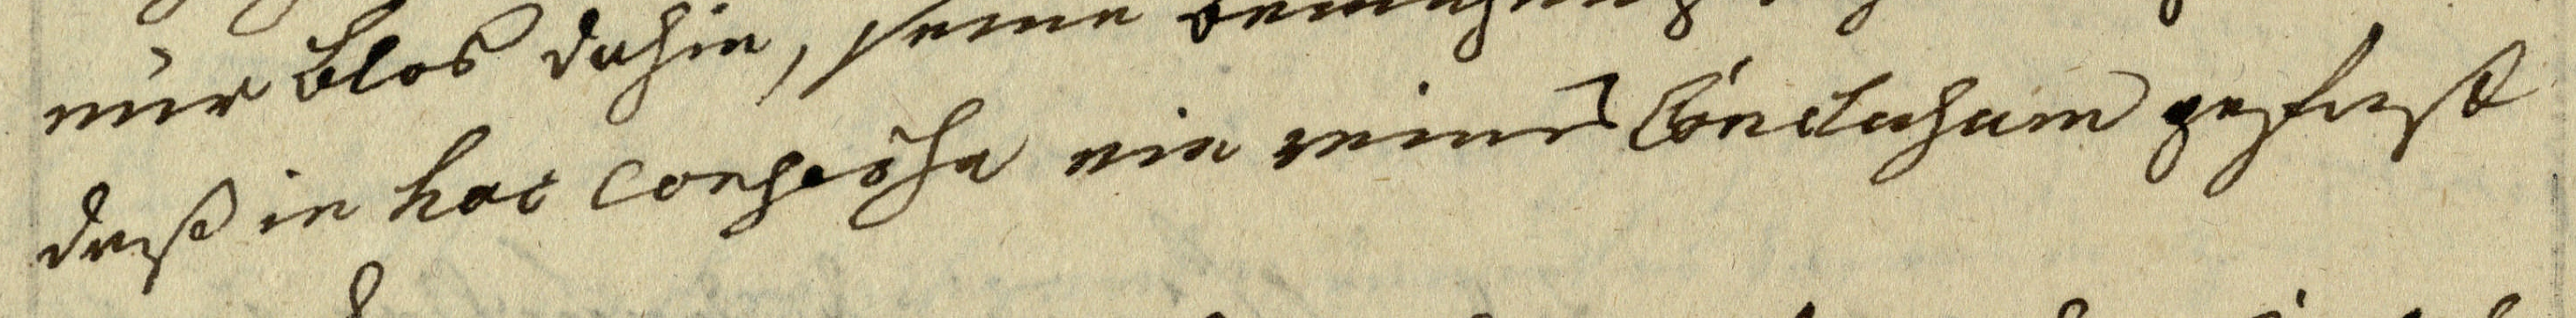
daß in hoc consessa ein reines Conclusum gefast
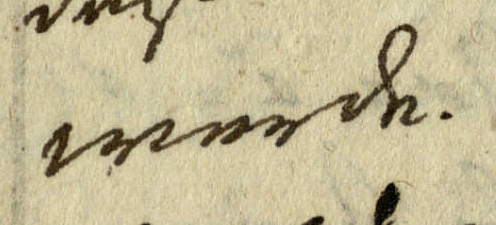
werde.
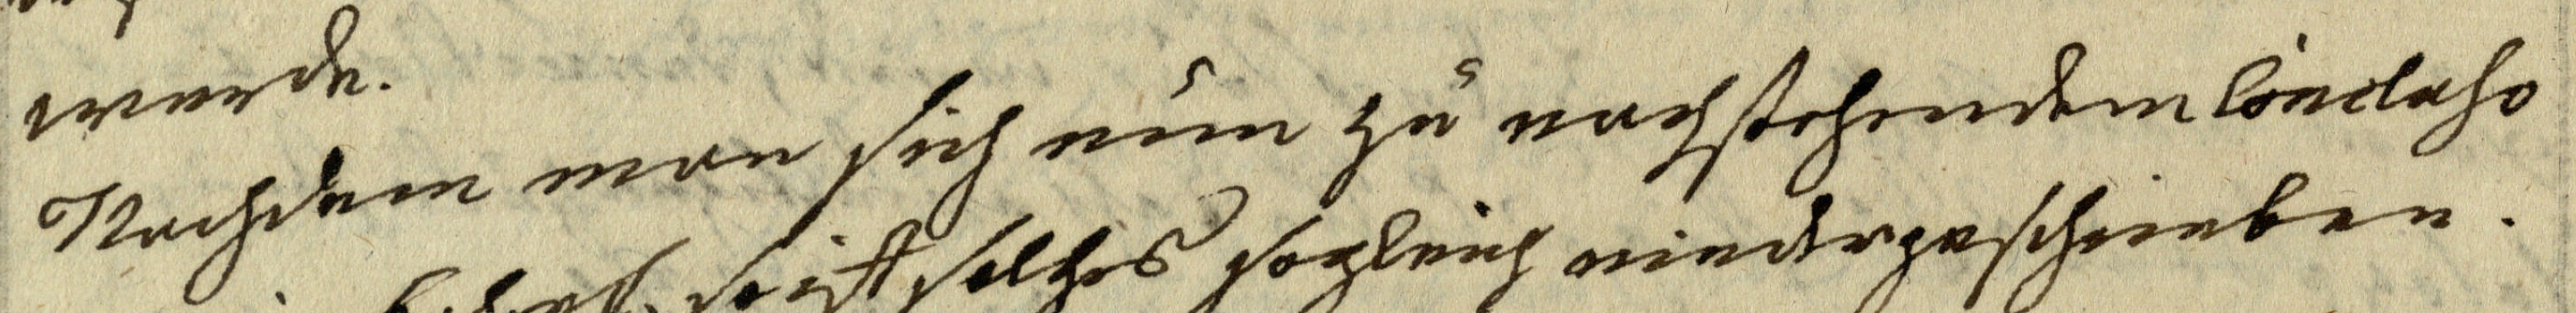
Nachdem man sich nun zu nachstehendem Concluso
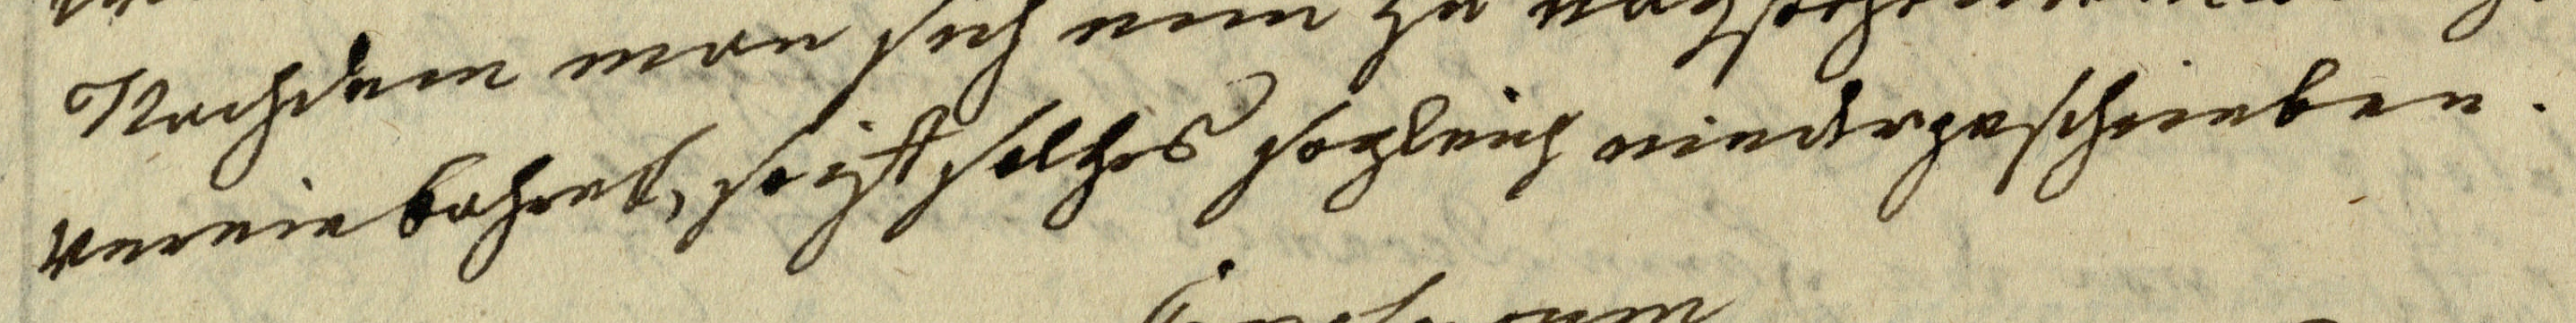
vereinbahret, so ist solches sogleich niedergeschrieben.
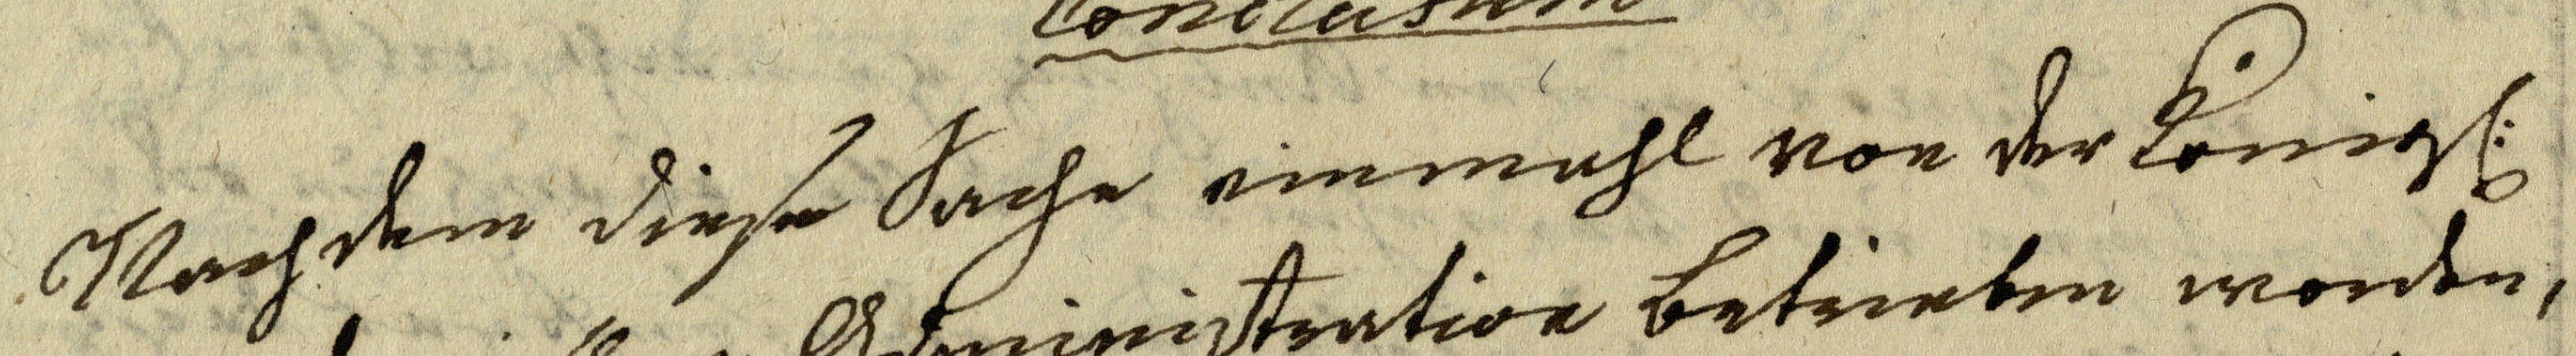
Nachdem diese Sache einmahl von der Königl.
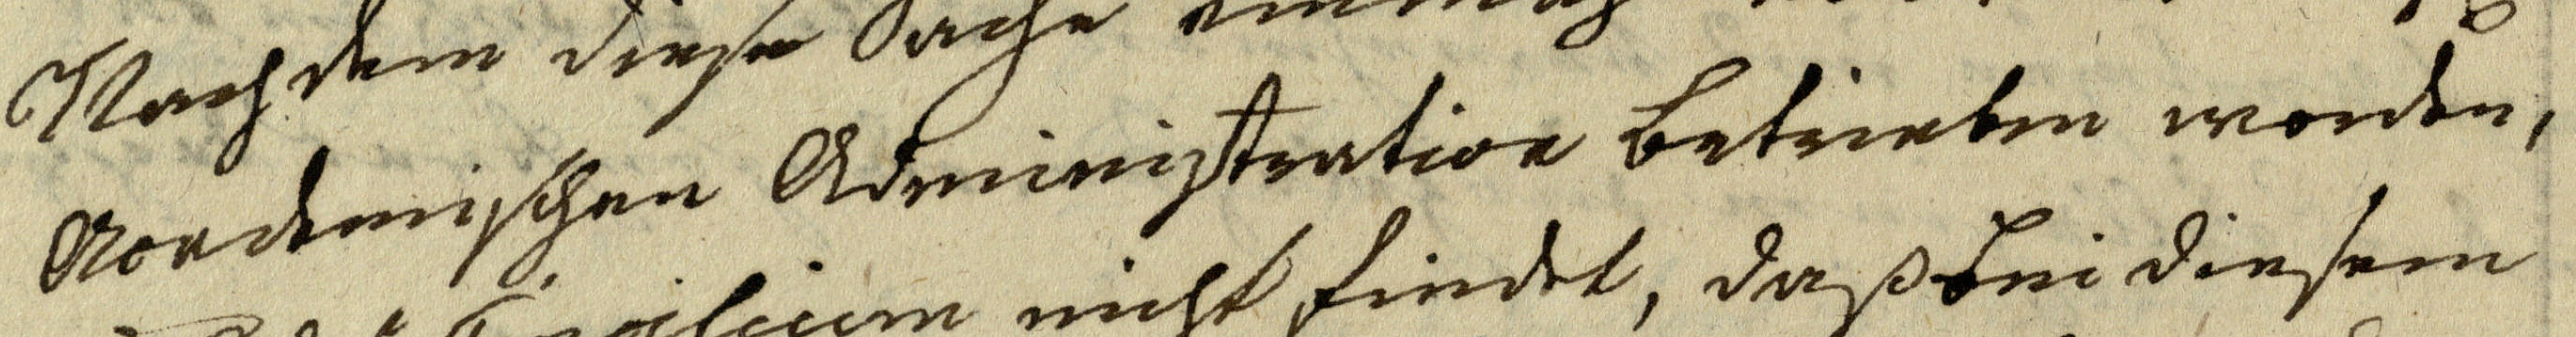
Academischen Administration betrieben worden,
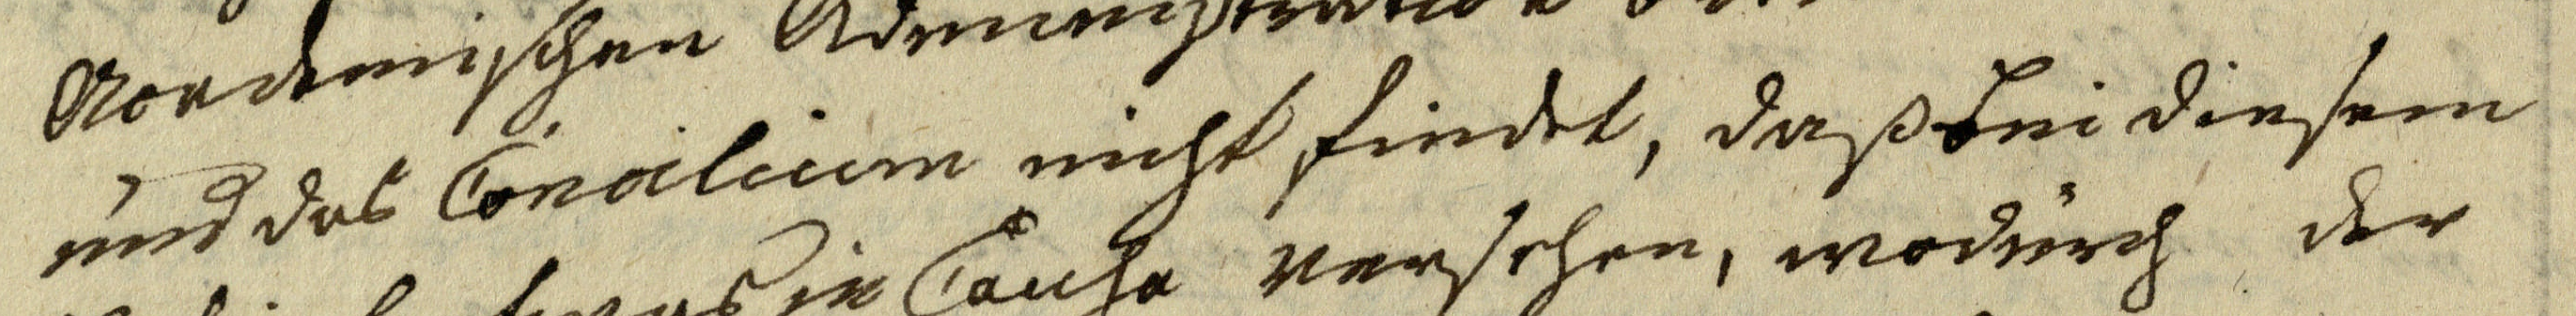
und das Concilium nicht findet, daß bei diesem
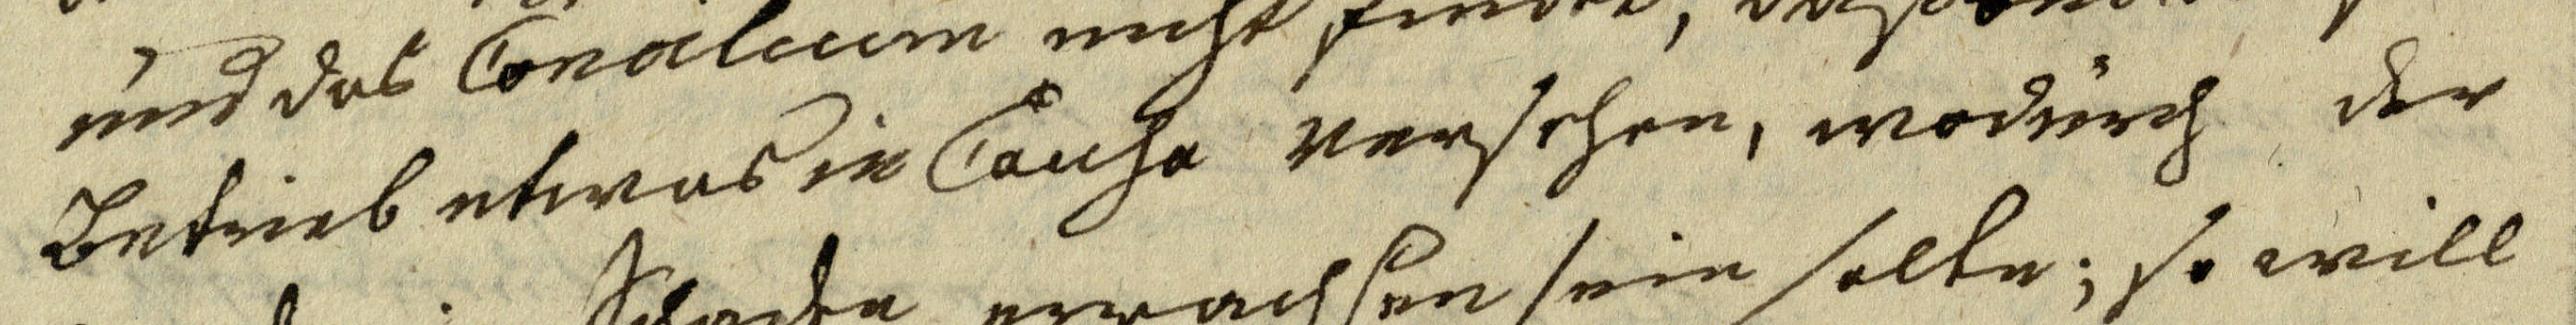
Betrieb etwas in Causa versehen, wodurch der
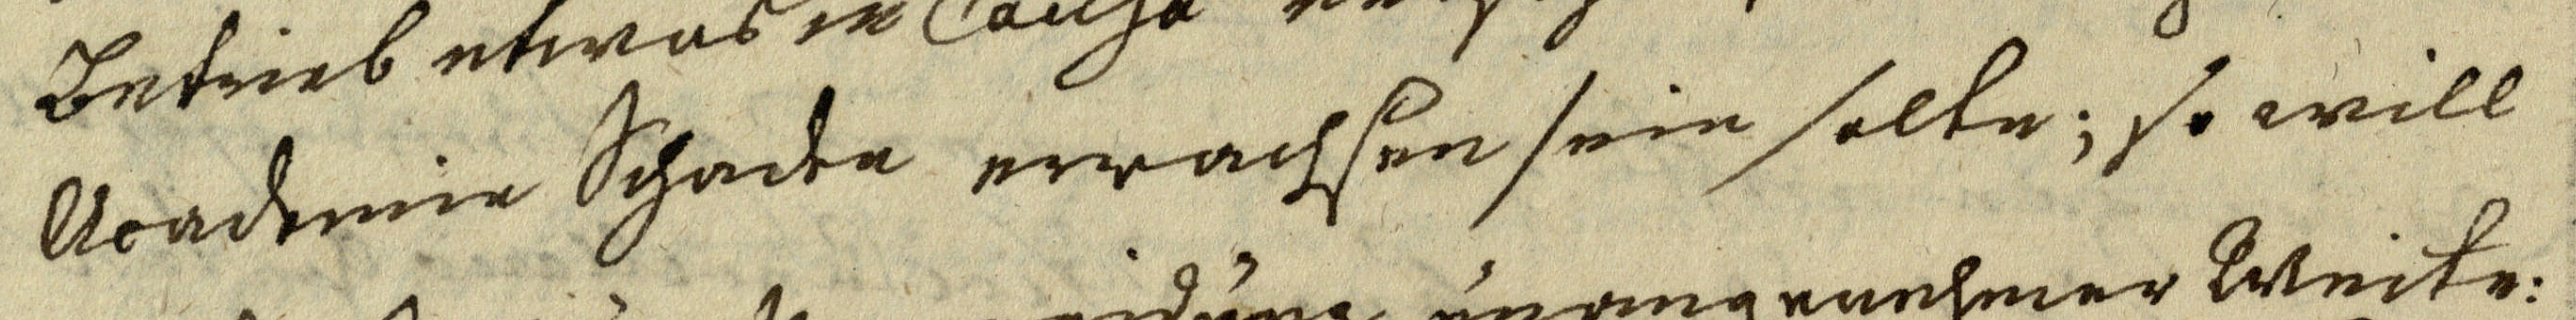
Academie Schaden erwachsen sein solte; so will
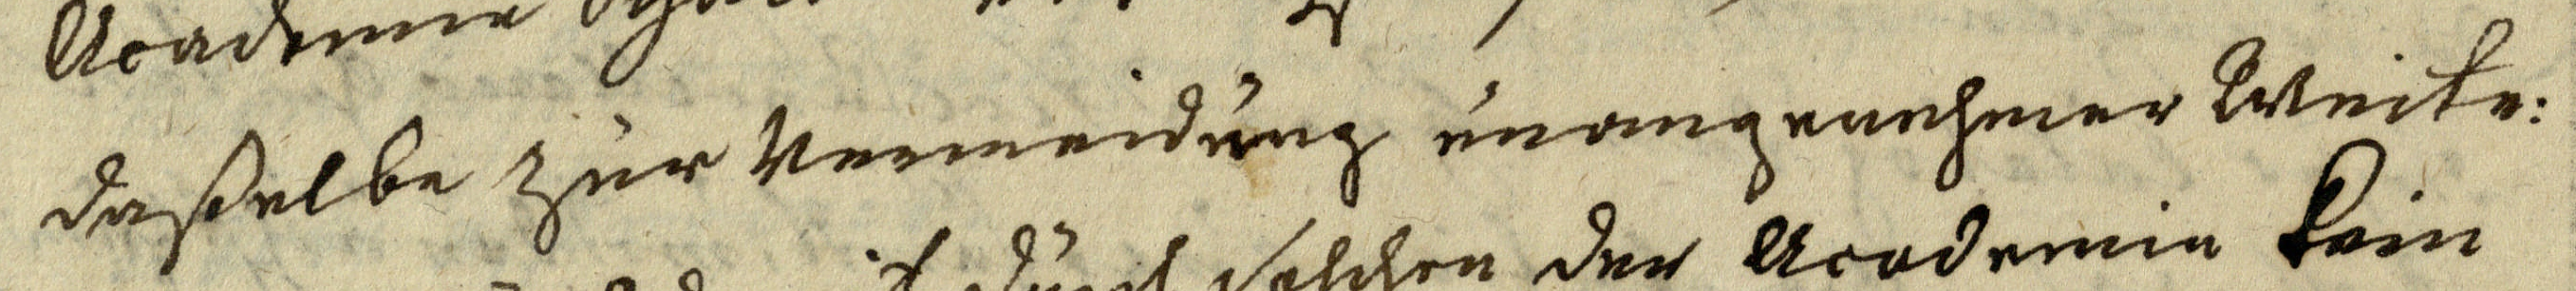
daßelbe zur Vermeidung unangenehmer Weite¬
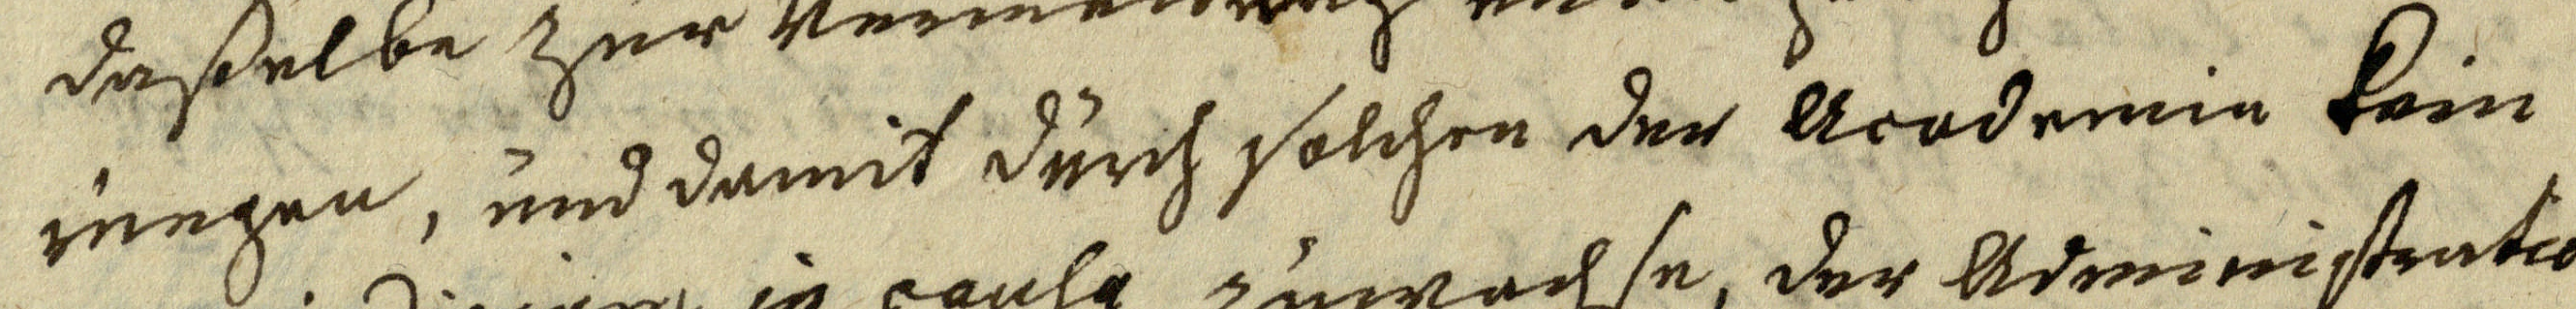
rungen, und damit durch solchen der Academie kein
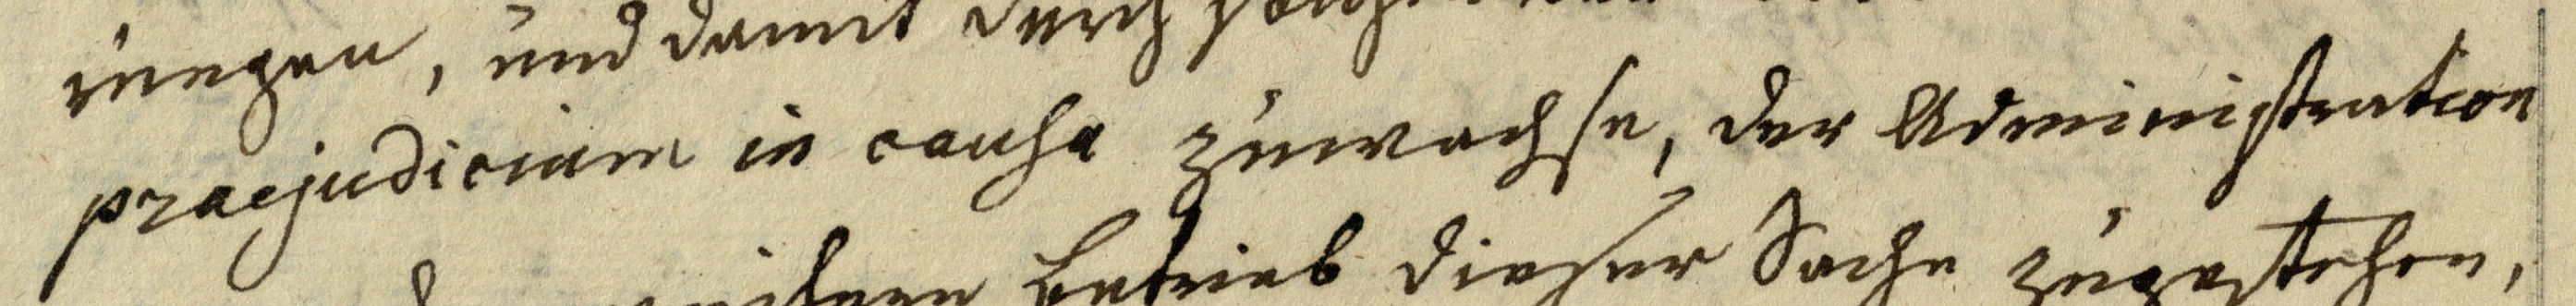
praejudicium in causa zuwachse, der Administration
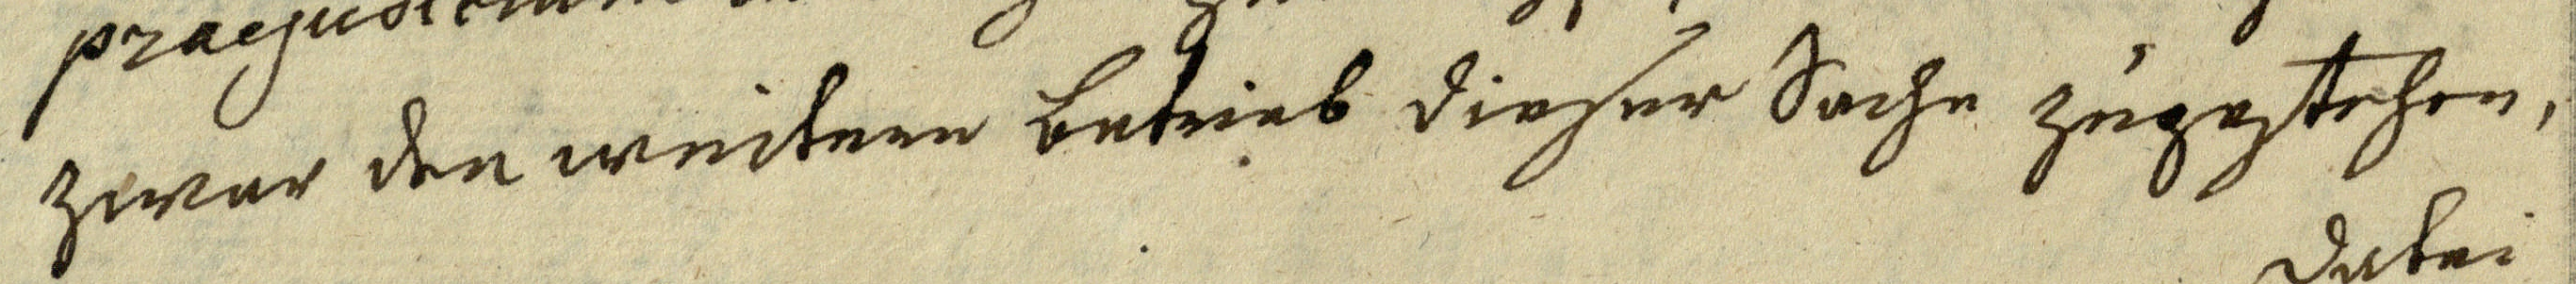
zwar den weitern Betrieb dieser Sache zugestehen,
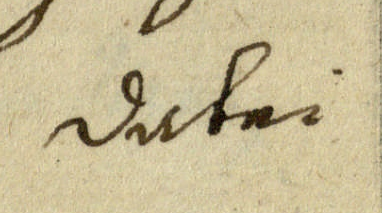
dabei
